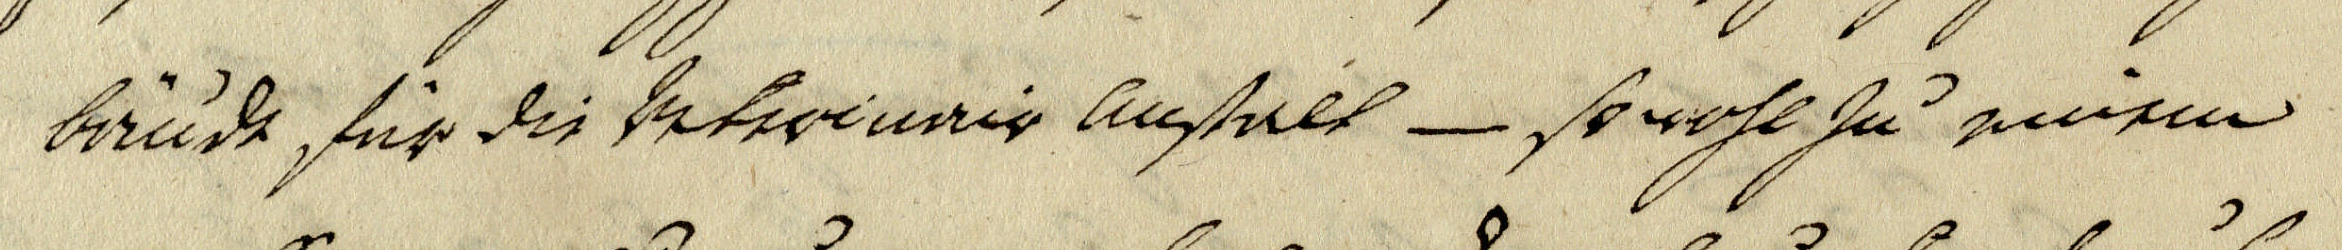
bäude für die Veterinair Anstalt so wohl zu einem
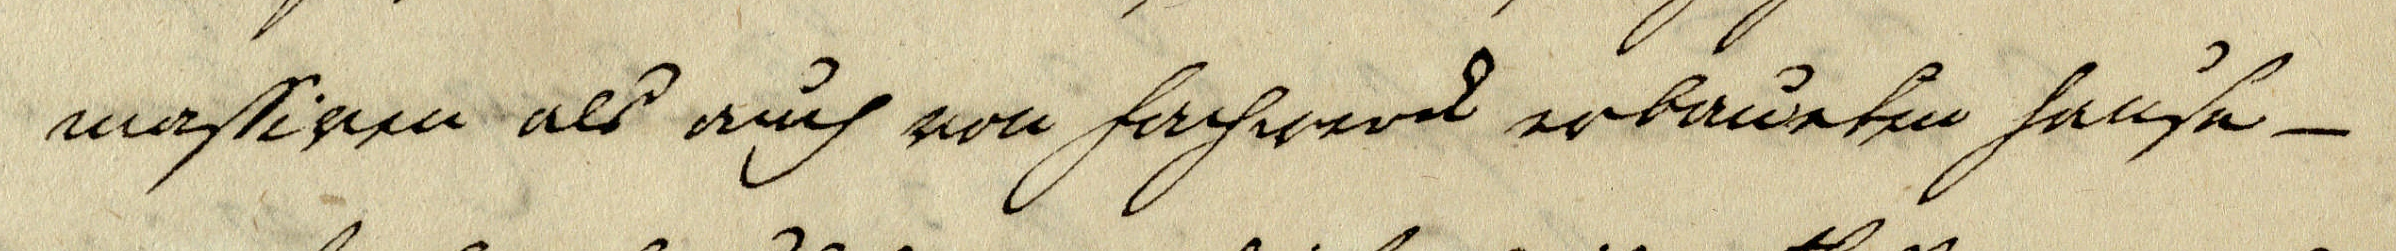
massiven als auch von Fachwerck erbaueten Hause
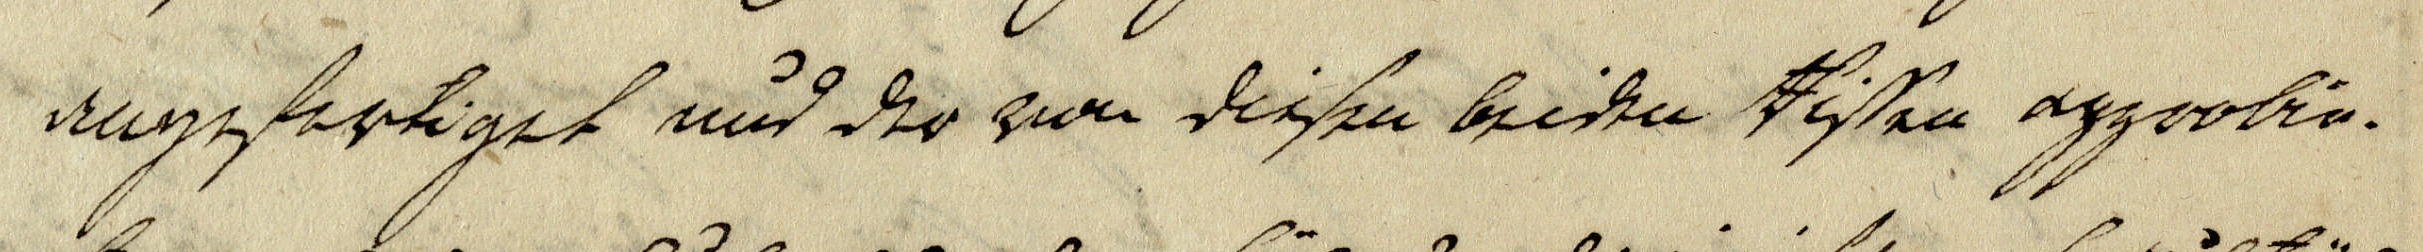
angefertiget und der von diesen beiden Rissen approbir¬
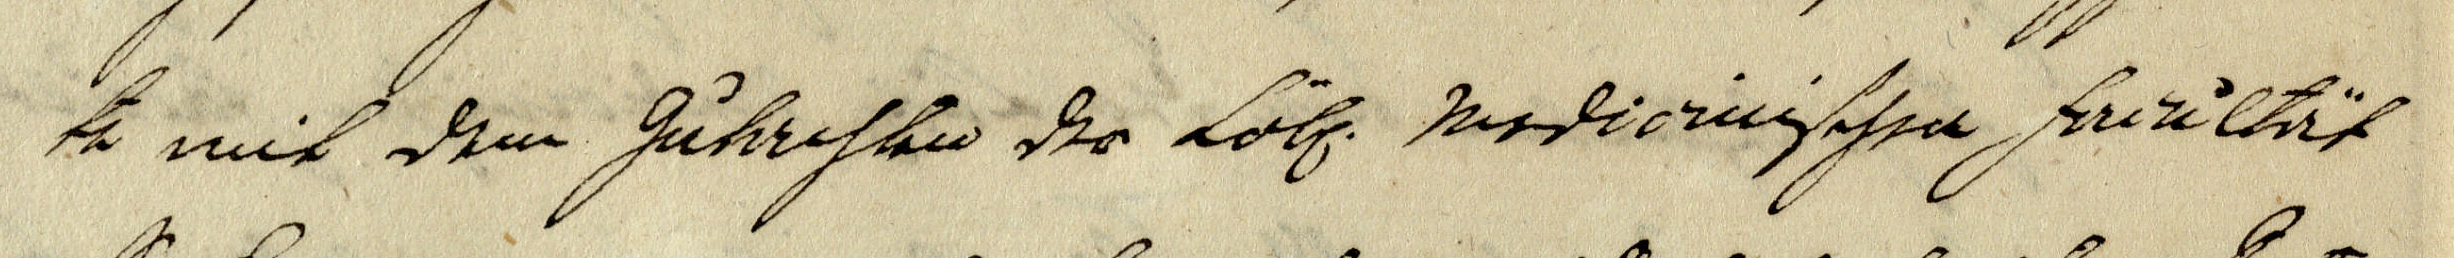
te mit dem Gutachten der Löbl. Medicinischen Facultät
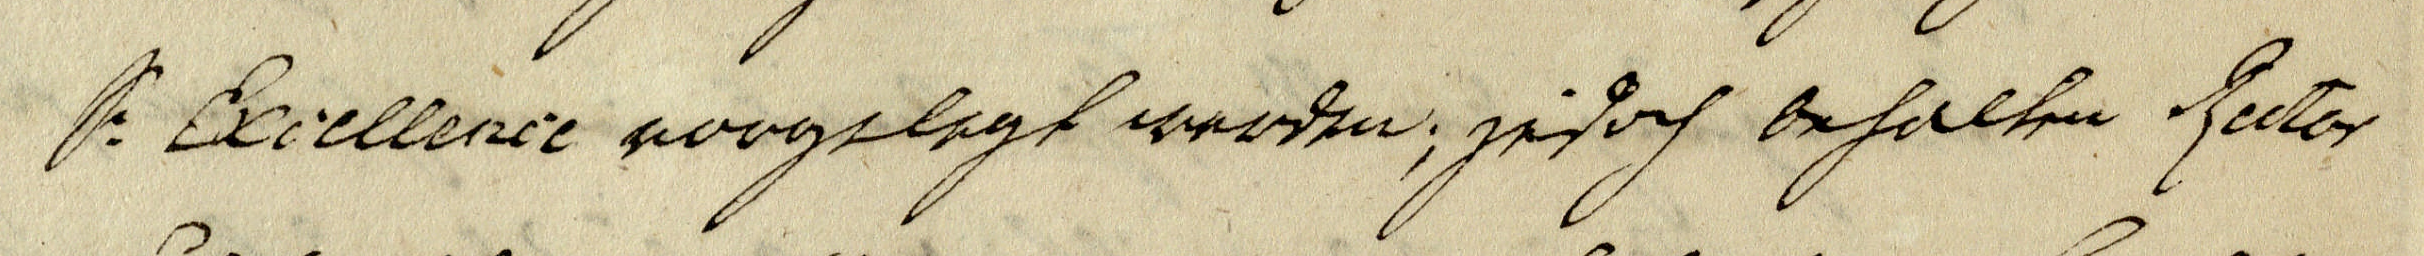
Sr Excellence vorgelegt werden, jedoch behalten Rector
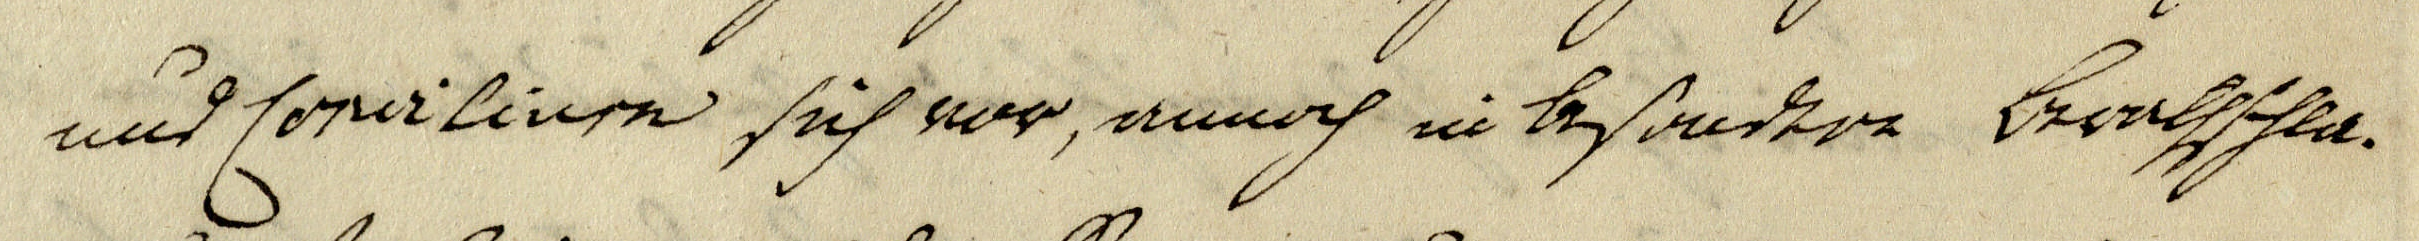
und Concilium sich vor, annoch in besondere Berathschla¬
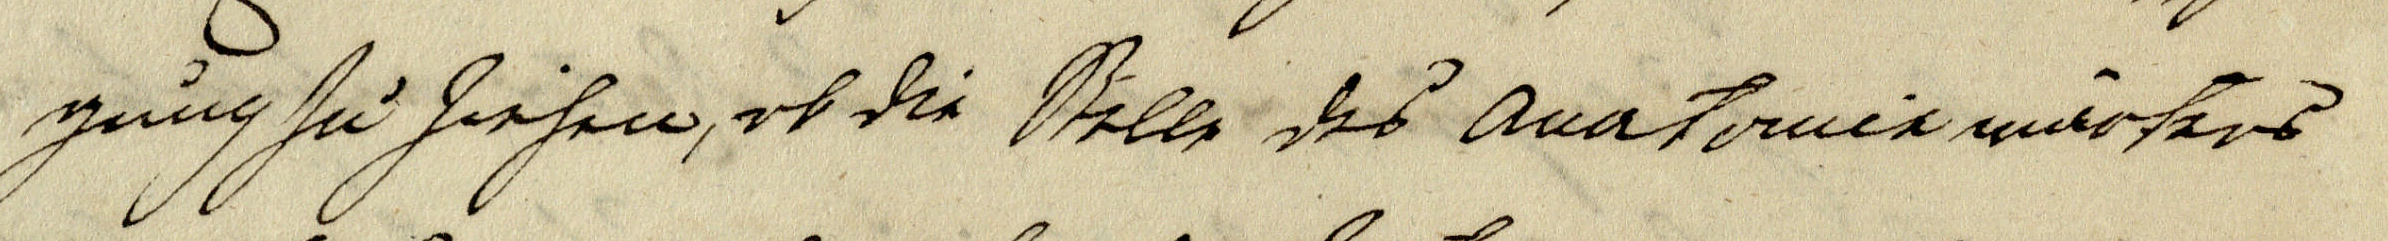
gung zu ziehen, ob die Stelle des Anatomiewärters
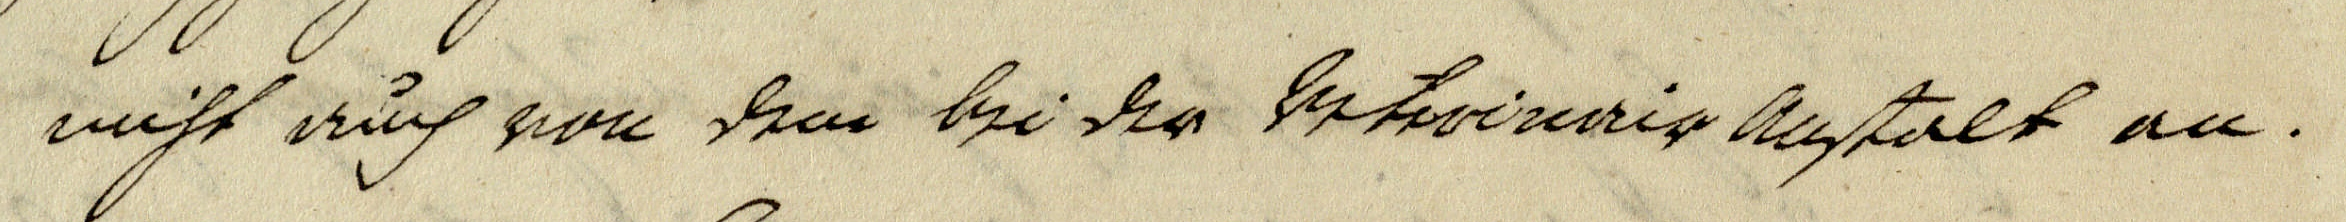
nicht auch von dem bei der Veterinair Anstalt an¬
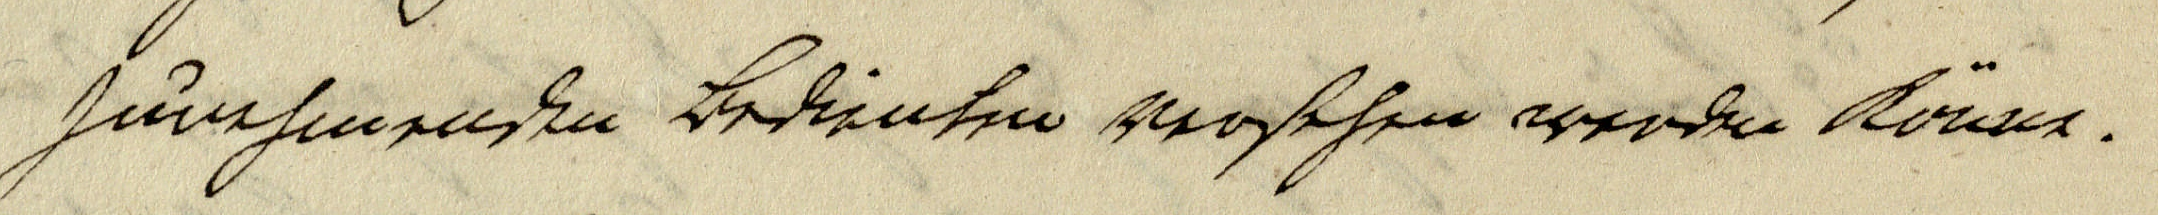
zunehmenden Bedienten versehen werden könne.
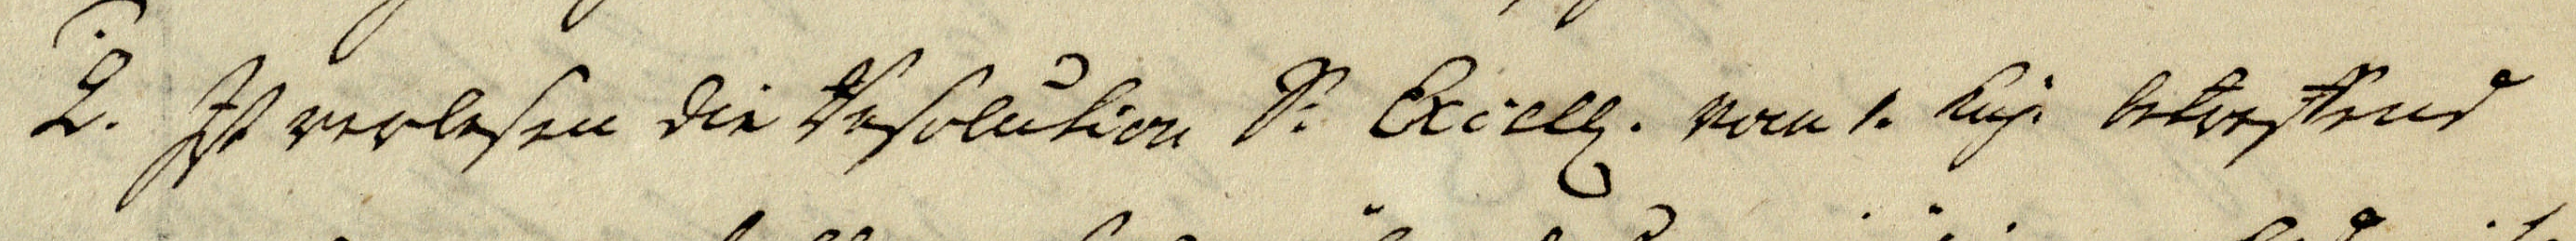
2. Ist verlesen die Resolution Sr. Excell. vom 1. huj. betreffend
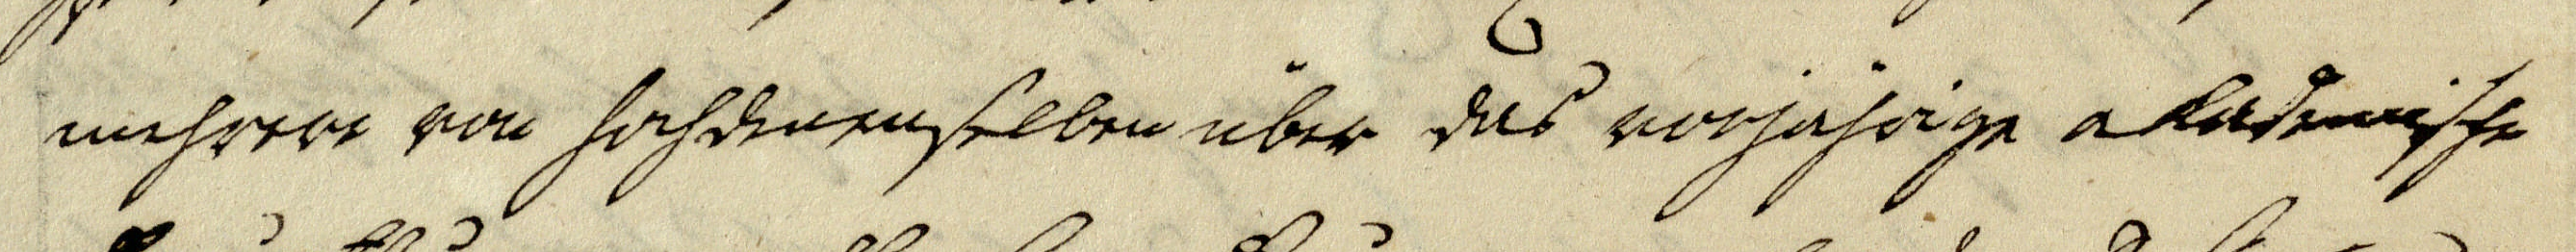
mehrere von hochdenenselben über das vorjährige akademische
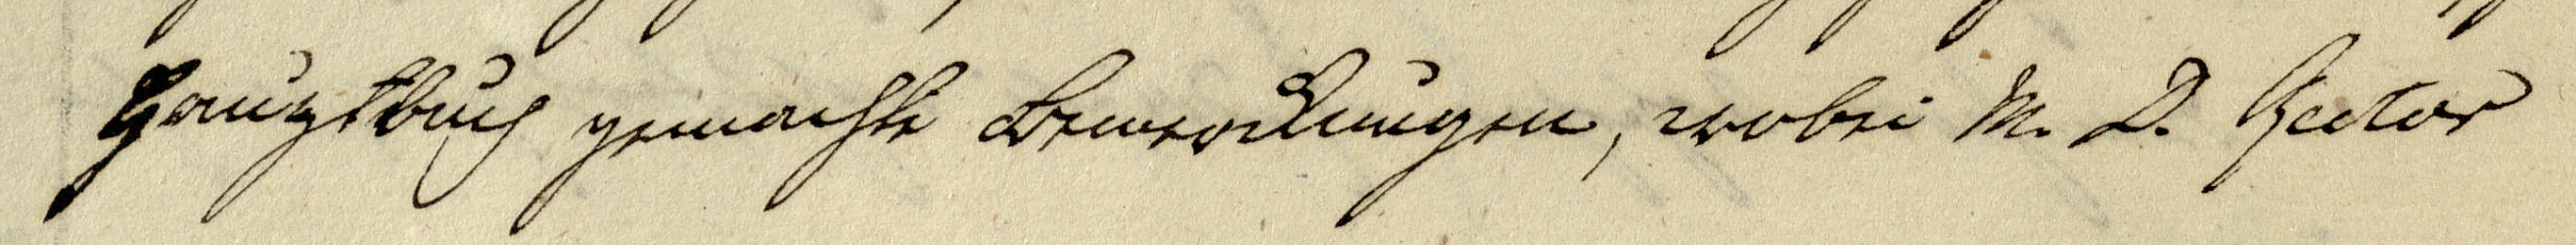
Hauptbuch gemachte Bemerckungen, wobei M. D. Rector
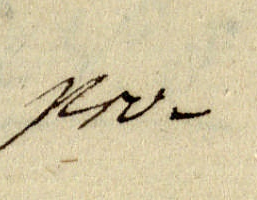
pro¬
